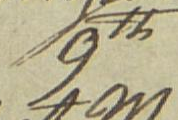9^th
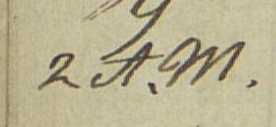2 A.M.
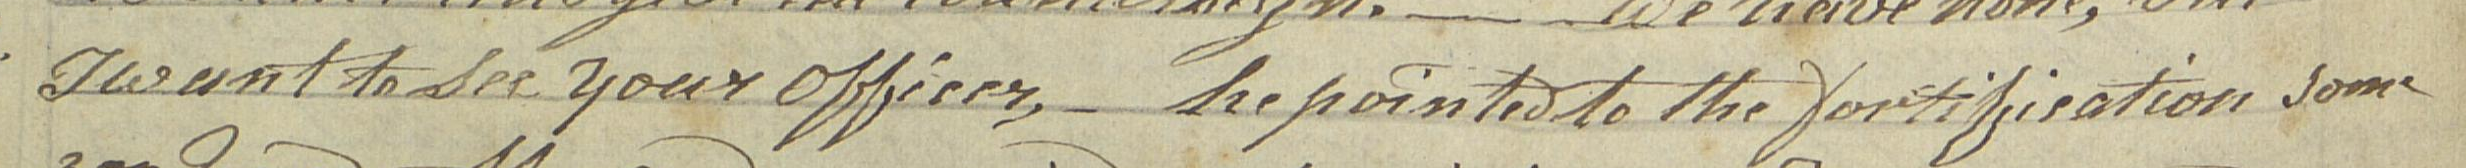I want to see your Officer, he pointed to the fortification some
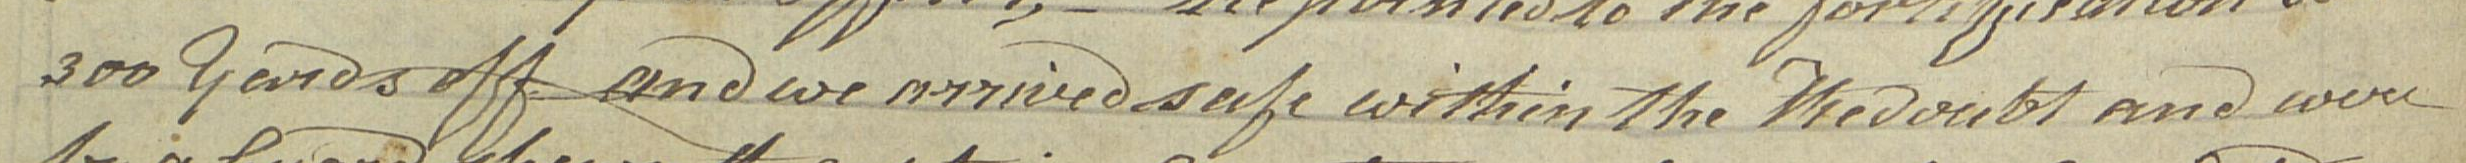300 Yards off and we arrived safe within the Redoubt and were
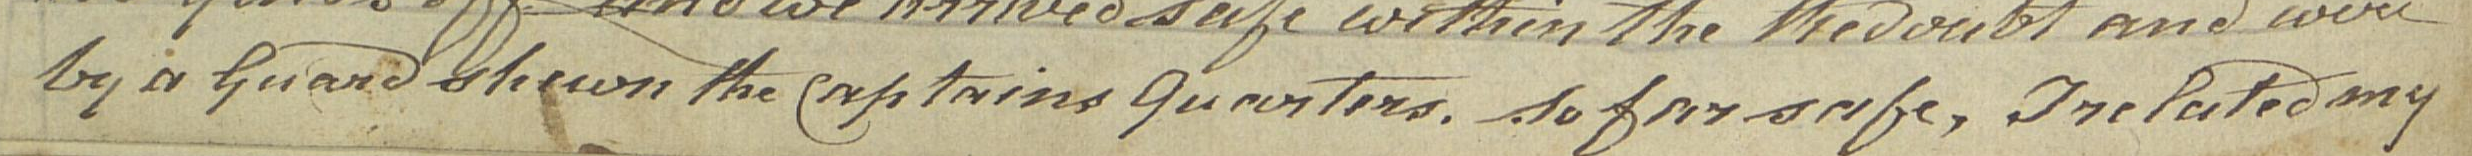by a Guard shewn the Captains quarters. So far safe, I related my
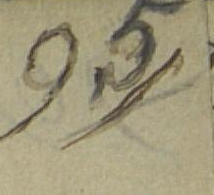95
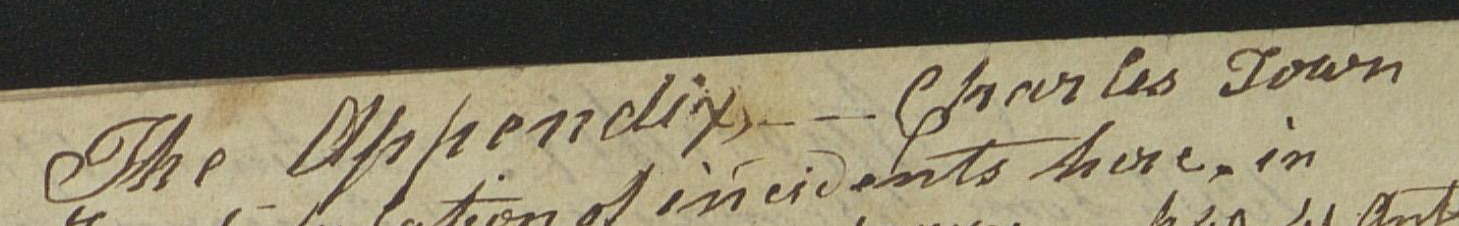The Appendix, Charles Town
